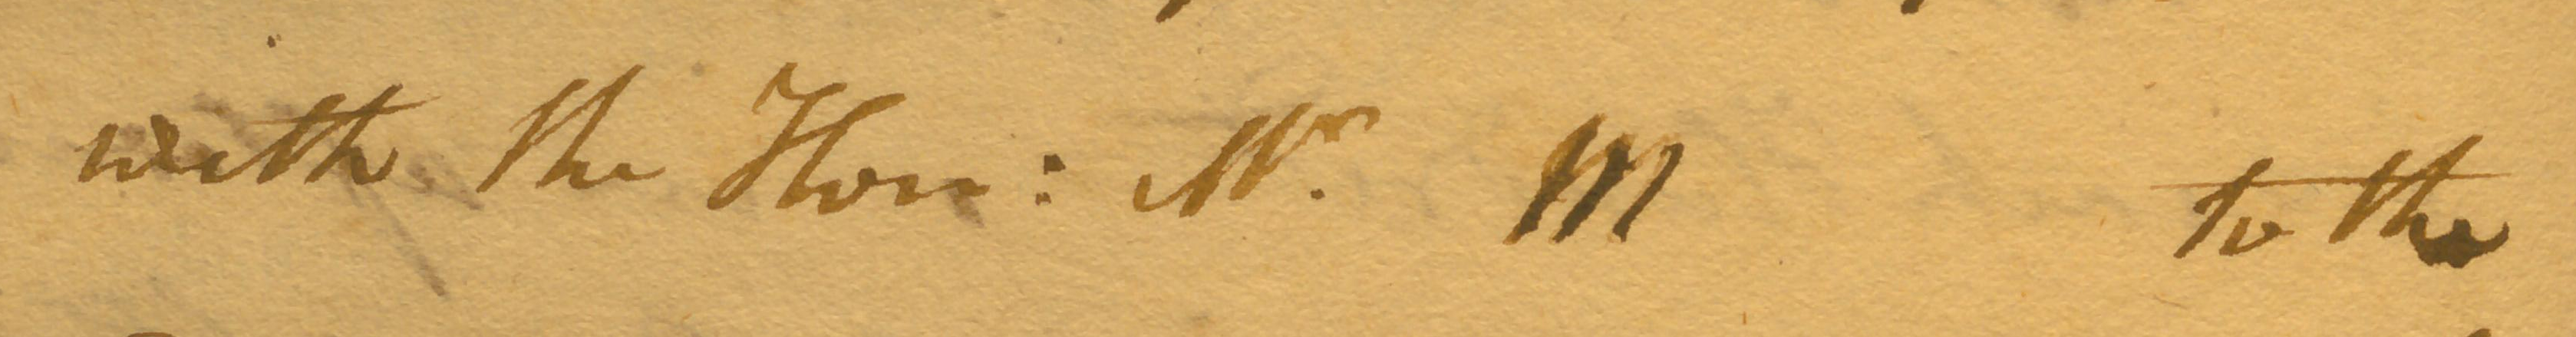with the Hon: M^r. M to the
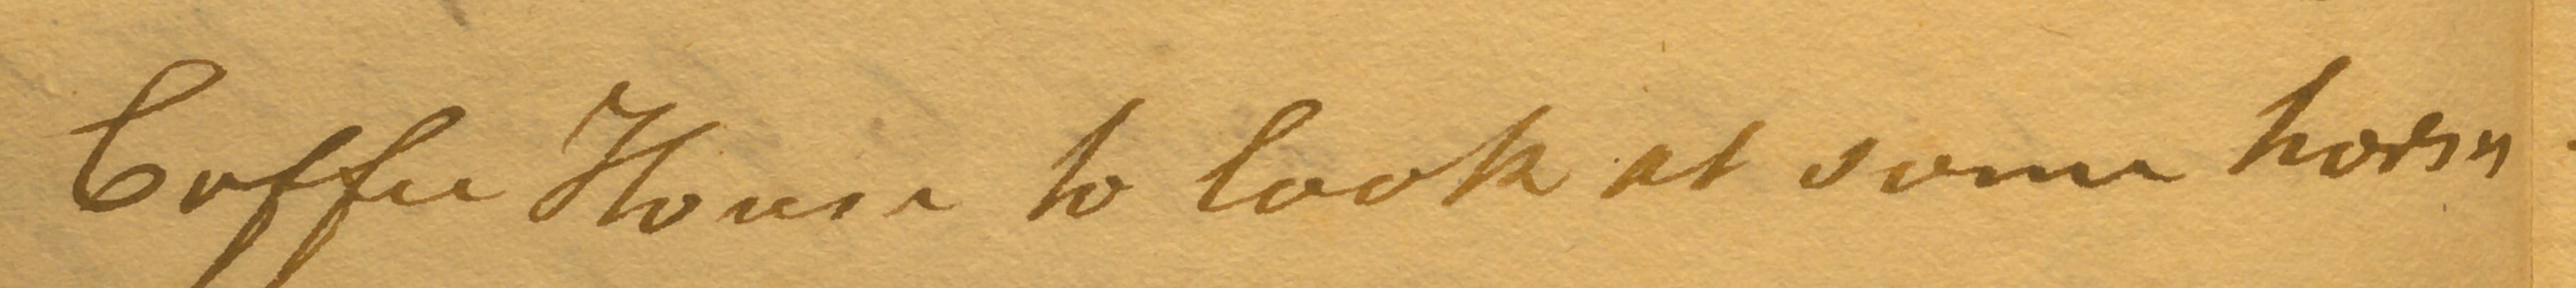Coffee House to look at some horses
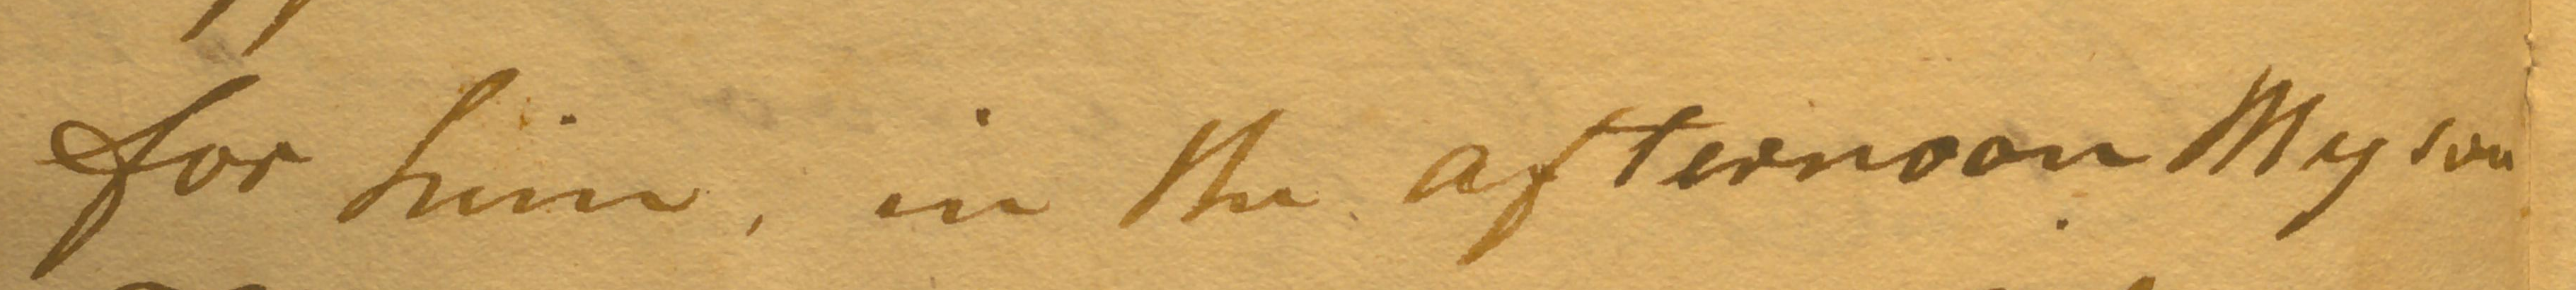for him in the afternoon My son
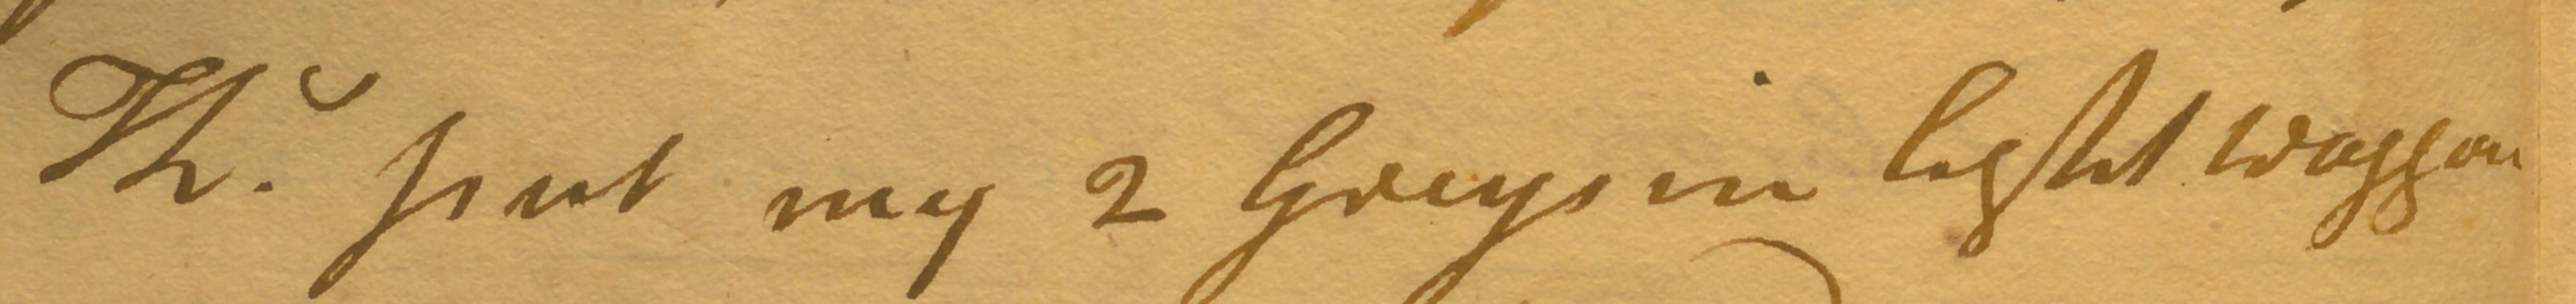Th^s. put my 2 Greys in light Waggon
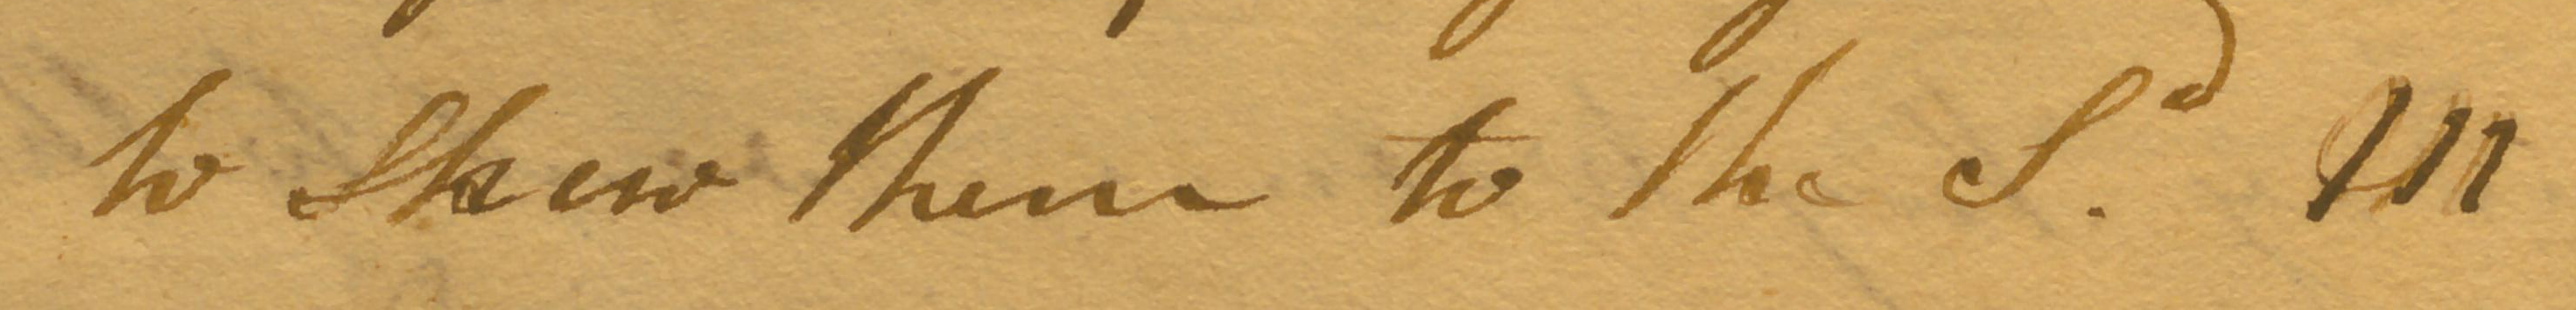to Shew them to the s^d. 111
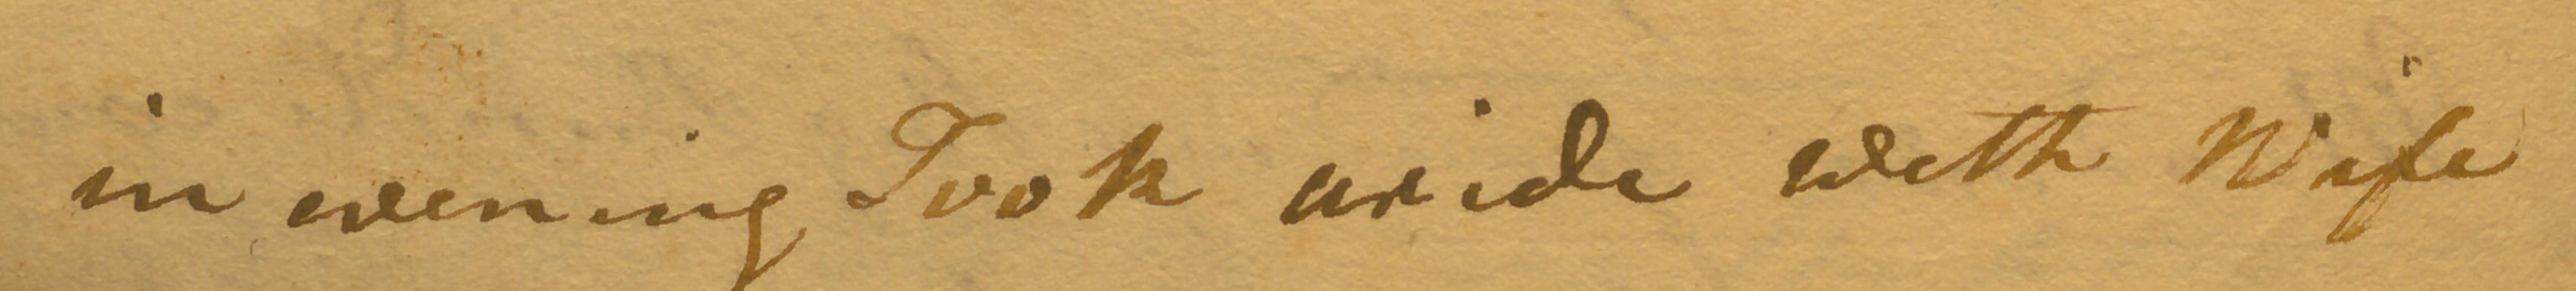in evening Took a ride with Wife
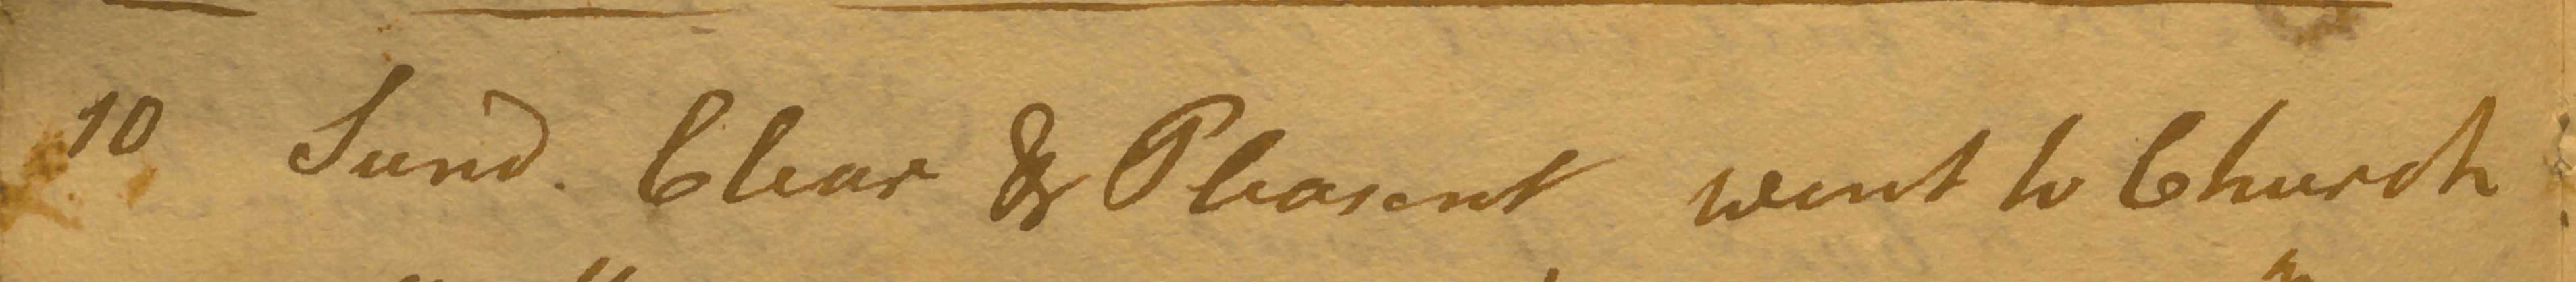10 Sund. Clear & Pleasent went to Churoh
